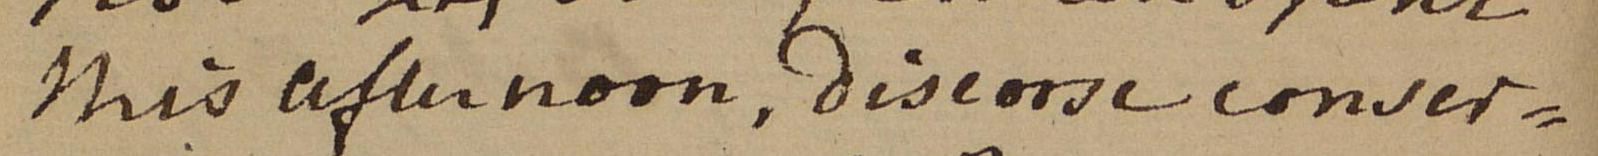this afternoon, discorse conser-
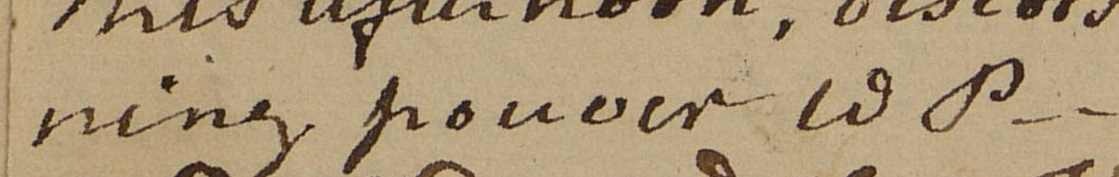ning pouver WP
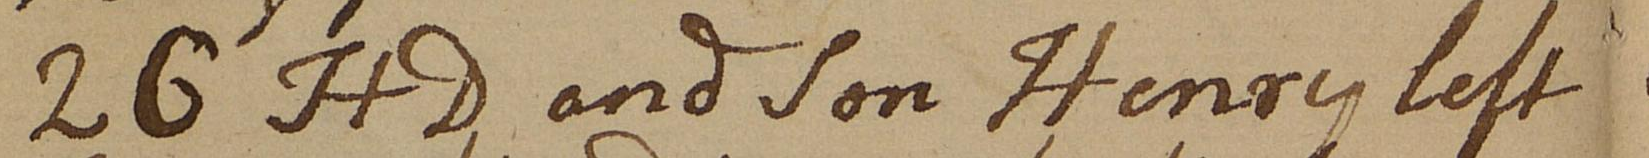26 HD and Son Henry left
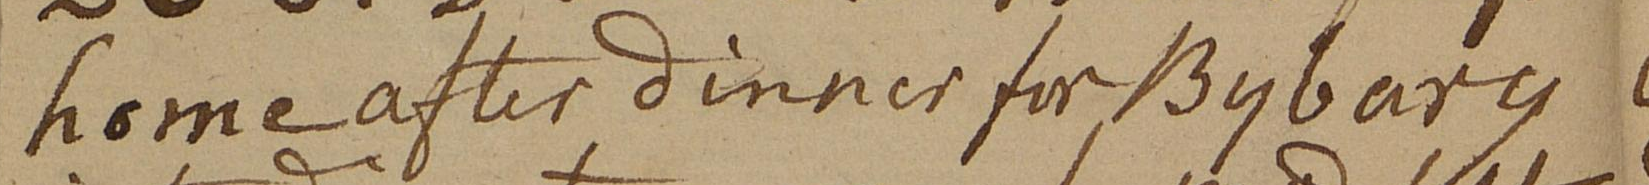home after dinner for Bybary
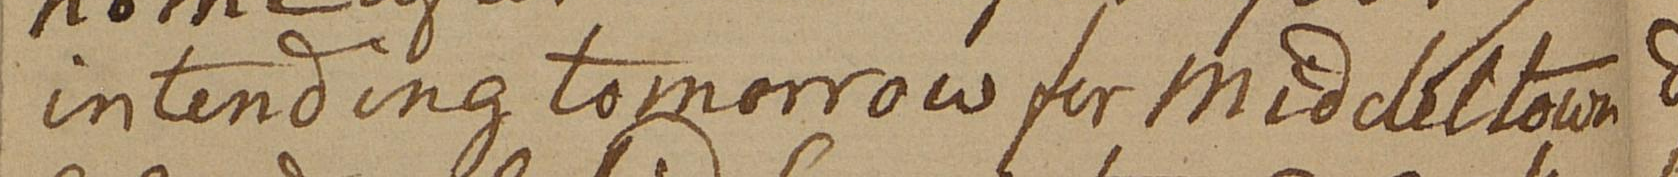intending tomorrow for Middletown
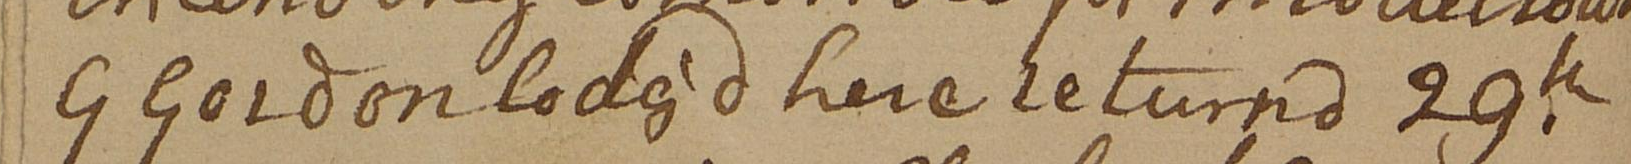G Gordon lodg'd here returnd 29^h.
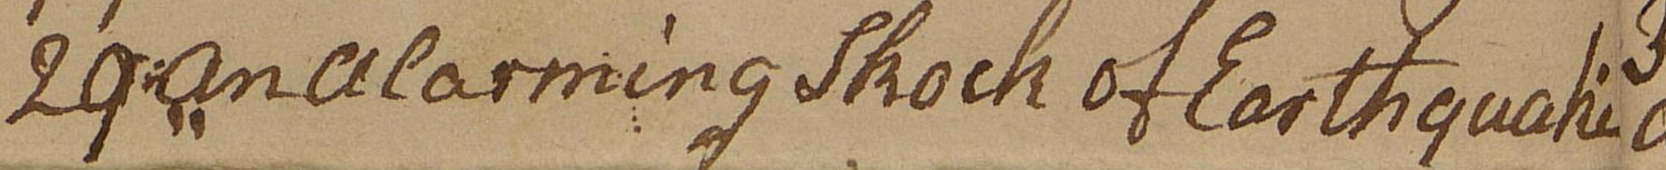29 An Alarming Shock of Earthquake
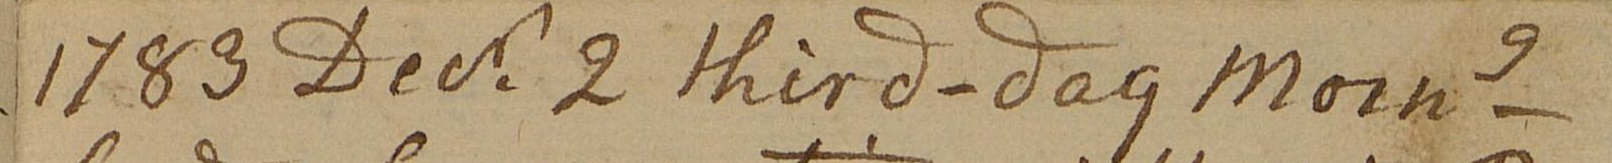1783 Dec^r. 2 third-day morn^g-
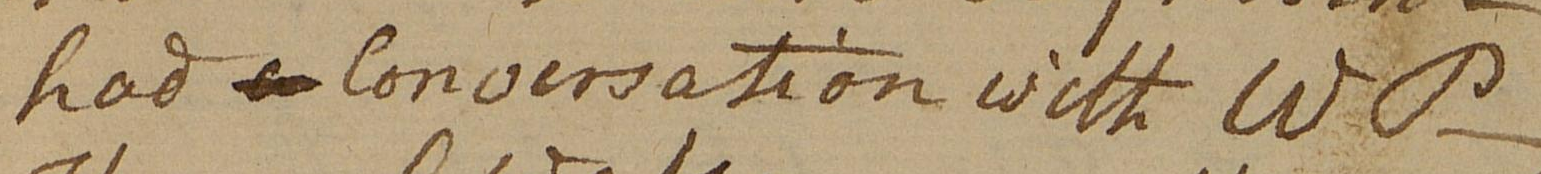had a Conversation with W P
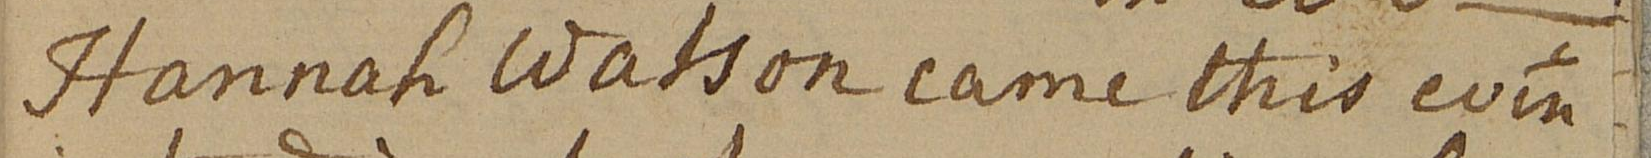Hannah Watson came this evin^g
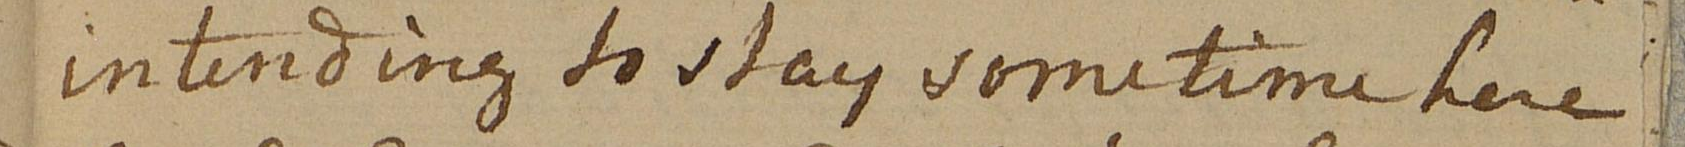intending to stay some time here
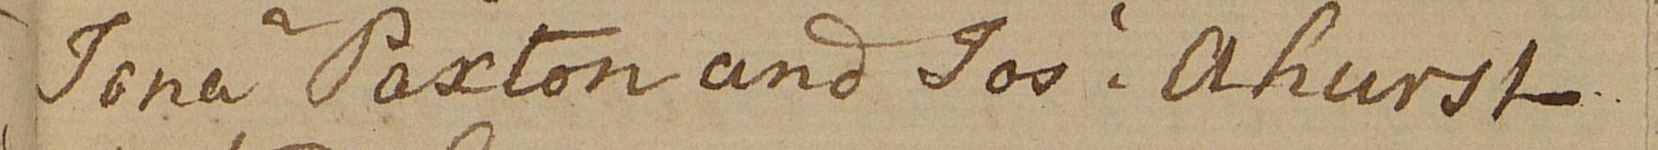[J]ona^a. Paxton and Jos: Ahurst
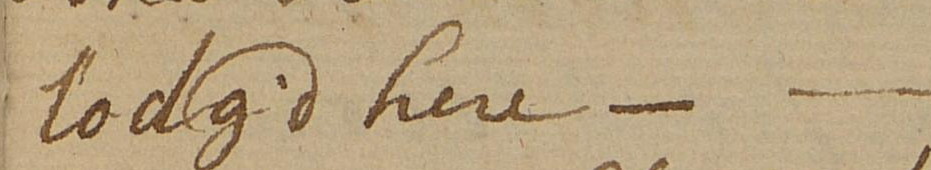lodg'd here--
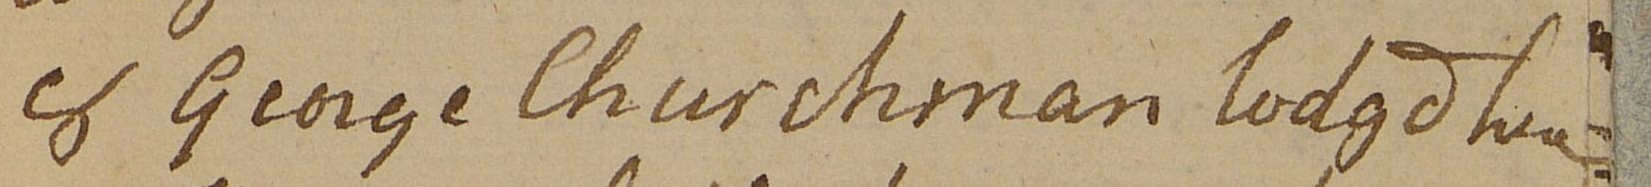8 George Churchman lodgd here
